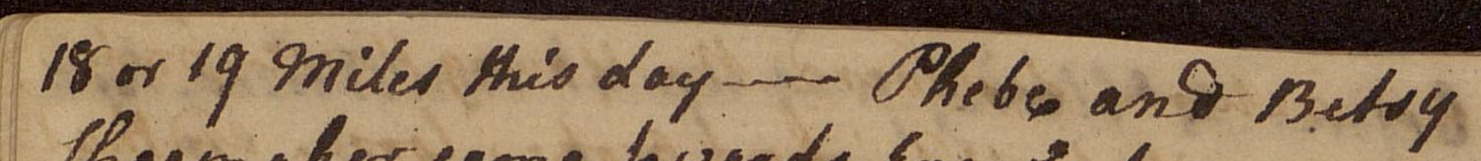18 or 19 Miles this day- Phebe and Betsy
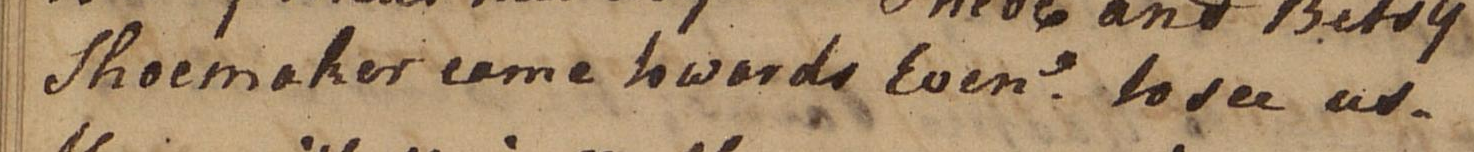Shoemaker came towards Even^g. to see us.
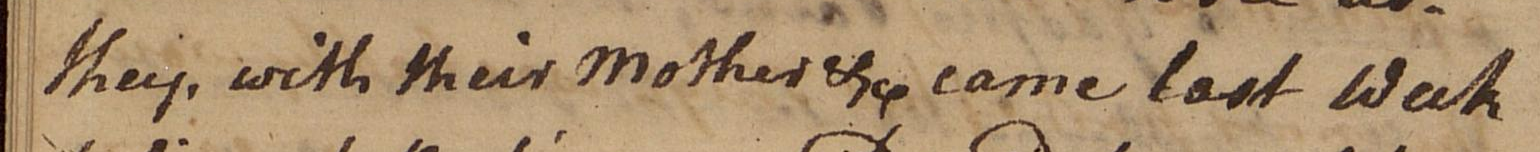they. with their mother &c came last Week
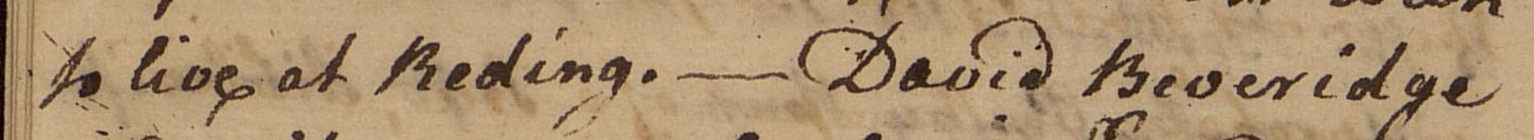to live at Reding.- David Beveridge
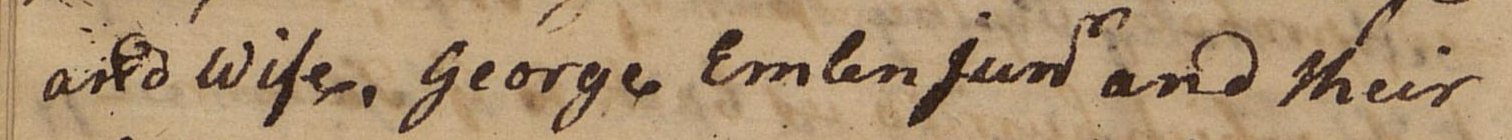and Wife, George Emlen Jun^r and their
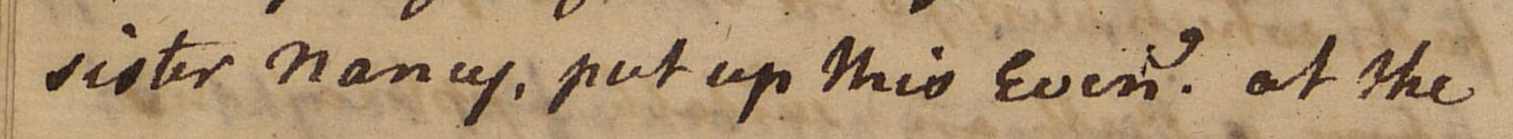sister Nancy, put up this Even^g. at the
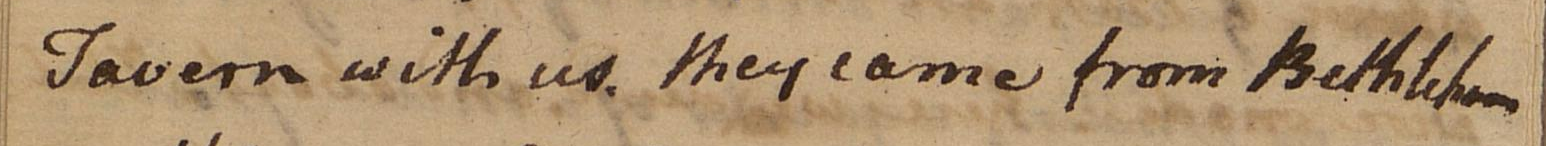Tavern with us they came from Bethlehem
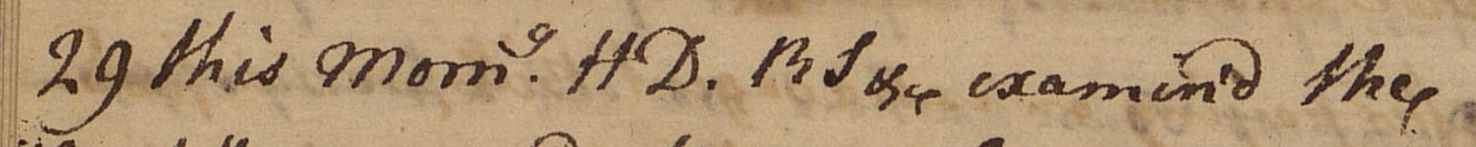29 this Morn^g. HD. R S &c examin'd the
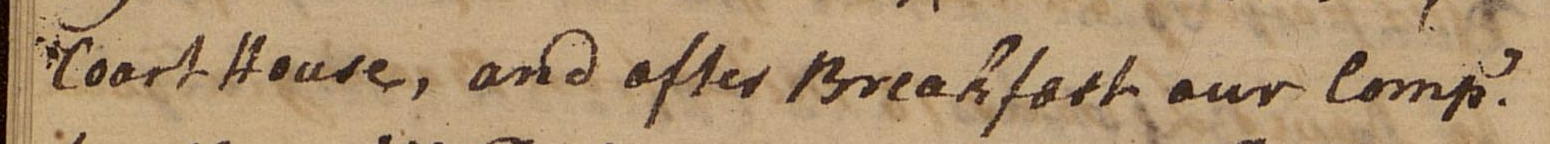Coart House, and after Breakfast our Comp^y.
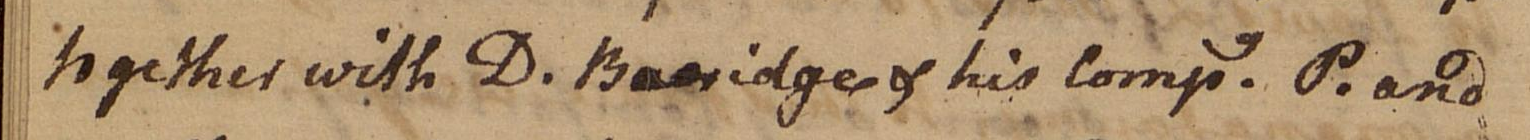together with D. Beveridge of his Comp^y. P. and
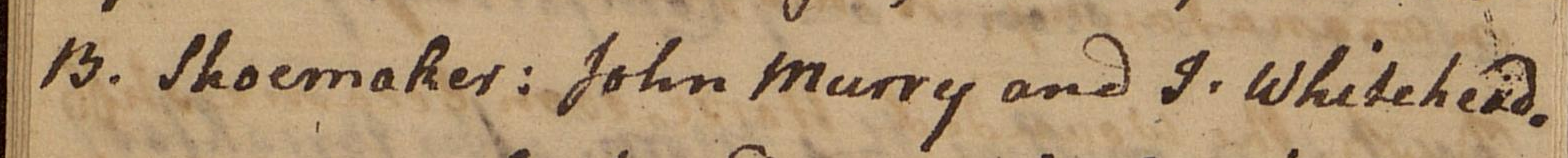B. Shoemaker: John Murry and J. Whitehead.
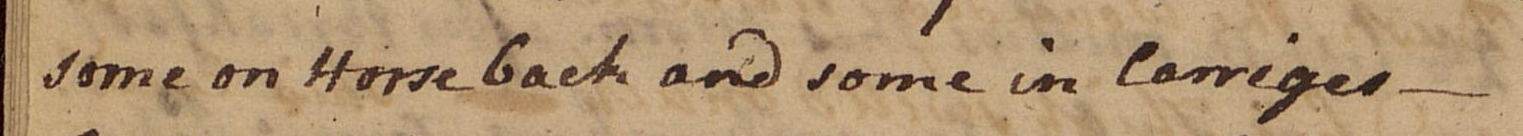some on Horse back and some in Carriges-
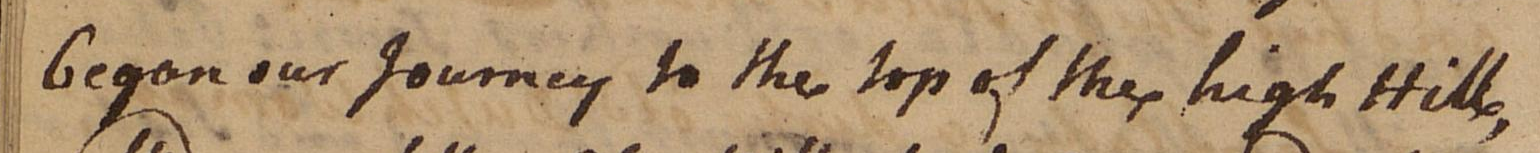began our Journey to the top of the high Hill,
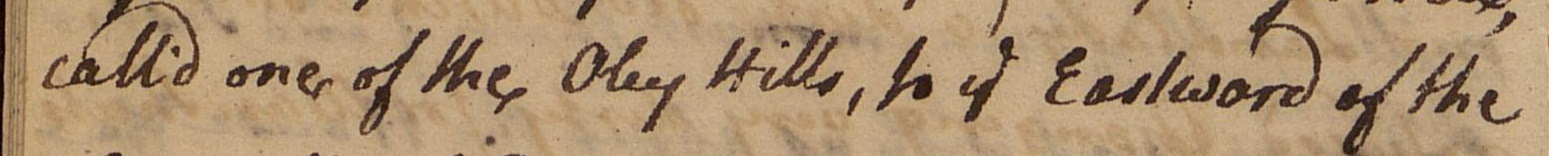call'd one of the Oley Hills, to y^E Eastward of the
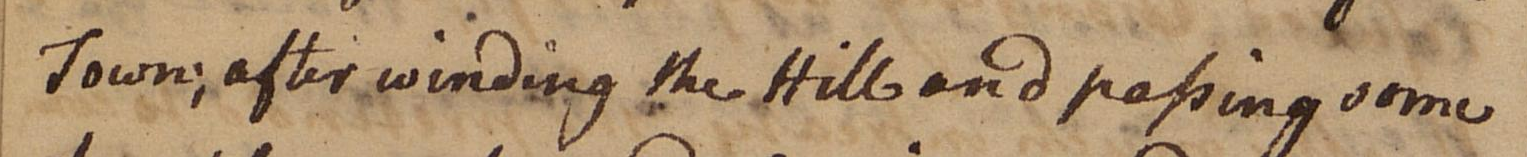Town; after winding the Hill and passing some
